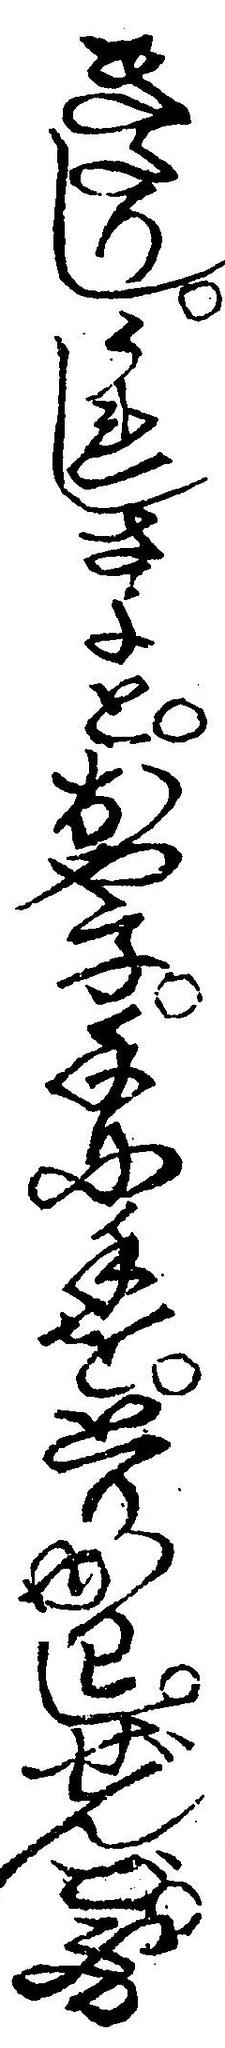きたりし。うれしさよと。おや子手に手をとりかわし。ぜんご。ふか
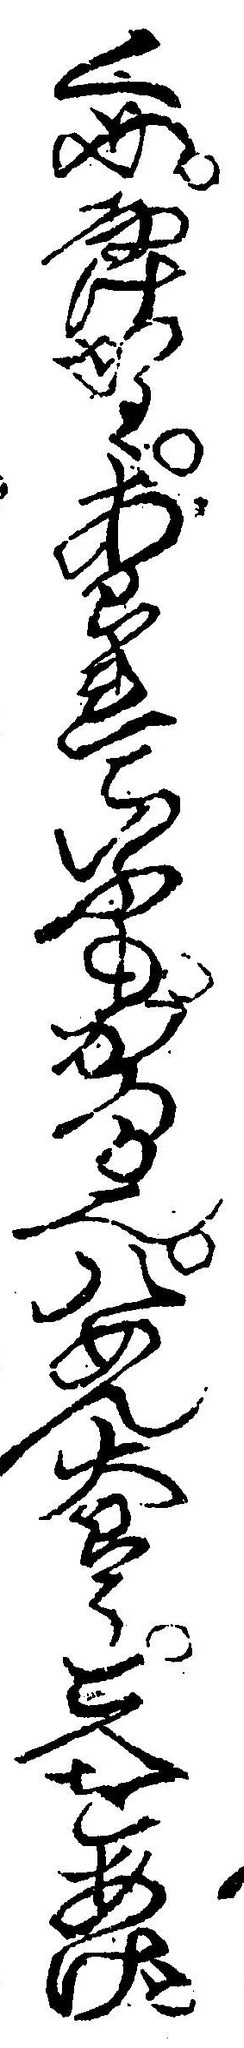くに。なけかるゝ。あわれといふも。おろか也。八めん大わう。こへをあげ。
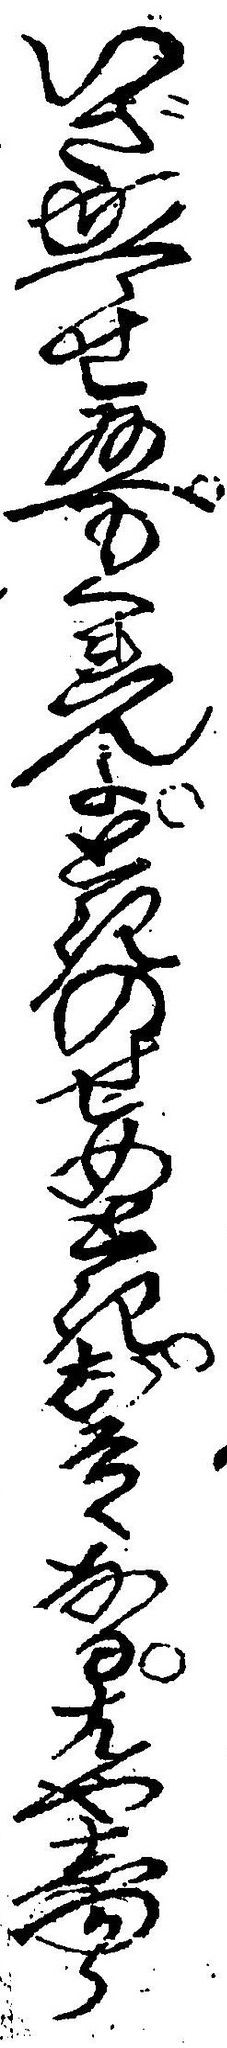いざかへらせ給へ。もくれんよ。ときのせめとき。おそくなる。はやしゆら

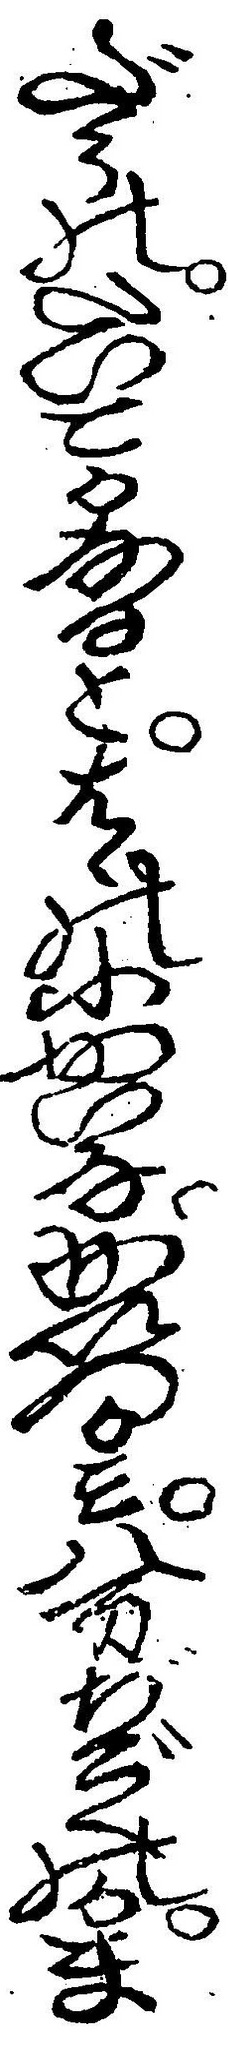だうの。たいこかなると。はゝの小かいな。かいつかみ。八万ぢごくのかま
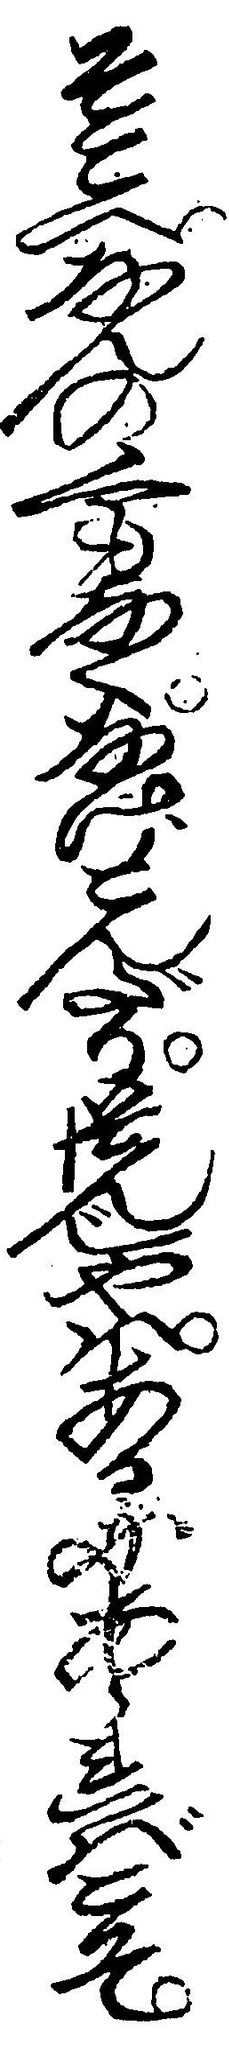そこへ。なんのくもなく。なけこんだり。そんじやは。あるにあらればこそ。
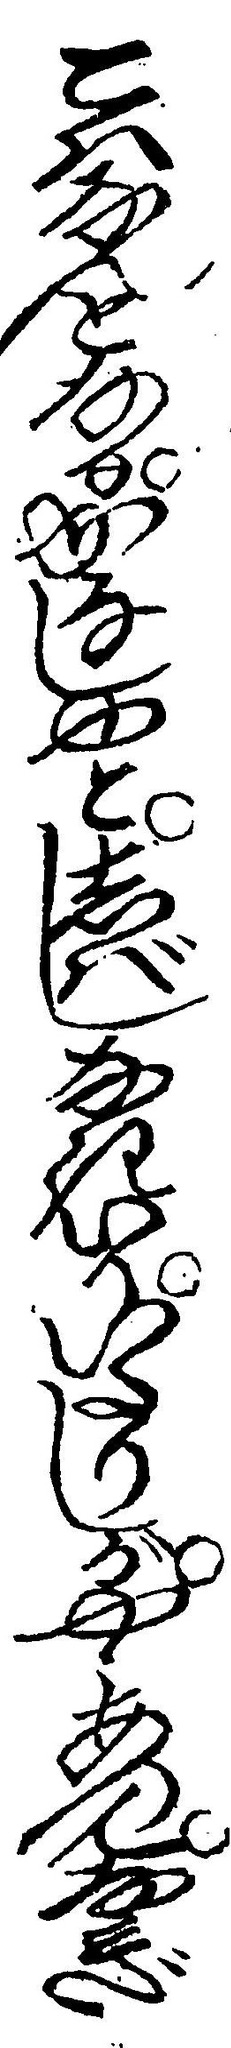こはなんとなる。かなしやと。しばしなきいり。いたりしが。やあつて。なみだ
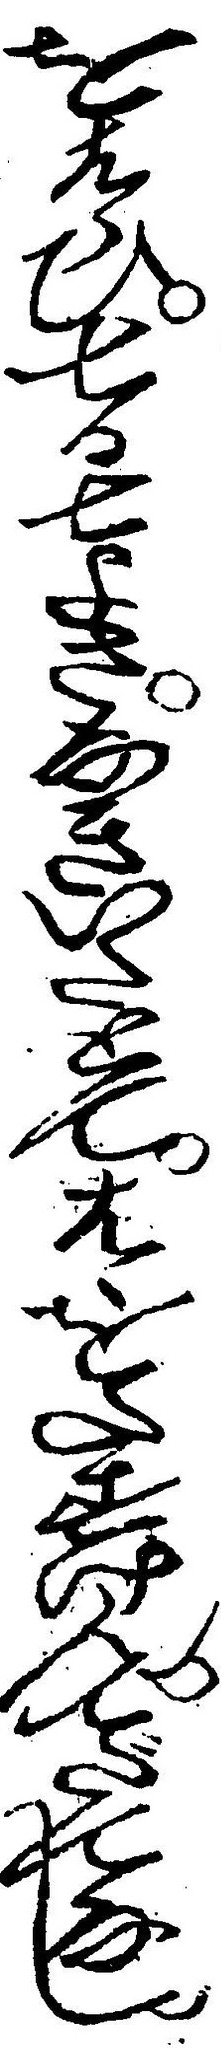をはらひ。七日七よさ。なきいたとて。はゝをたすけん。てだてなし。
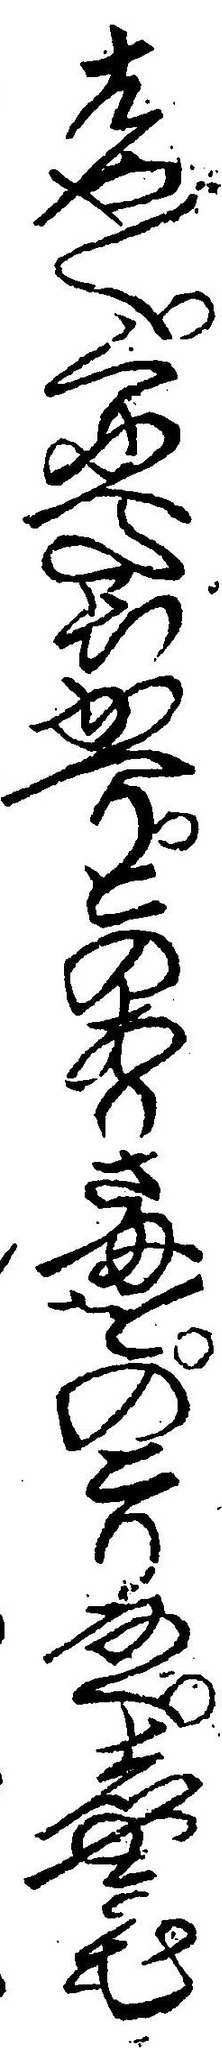はやく。くにたちかへり。このありさまを。のこりなく。しやかむ
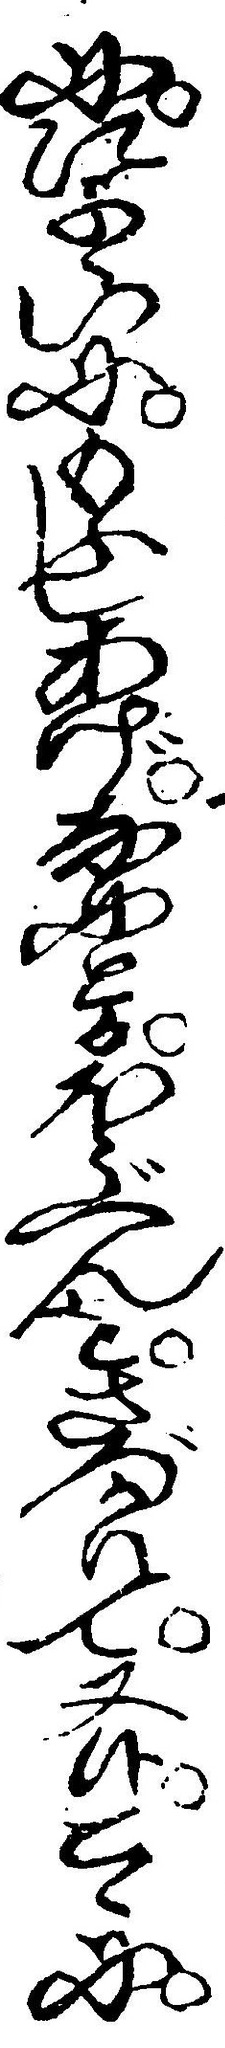に。によらいに。もふしあげ。なにとか。ほうべんを。さづかりて。又候。こゝに。
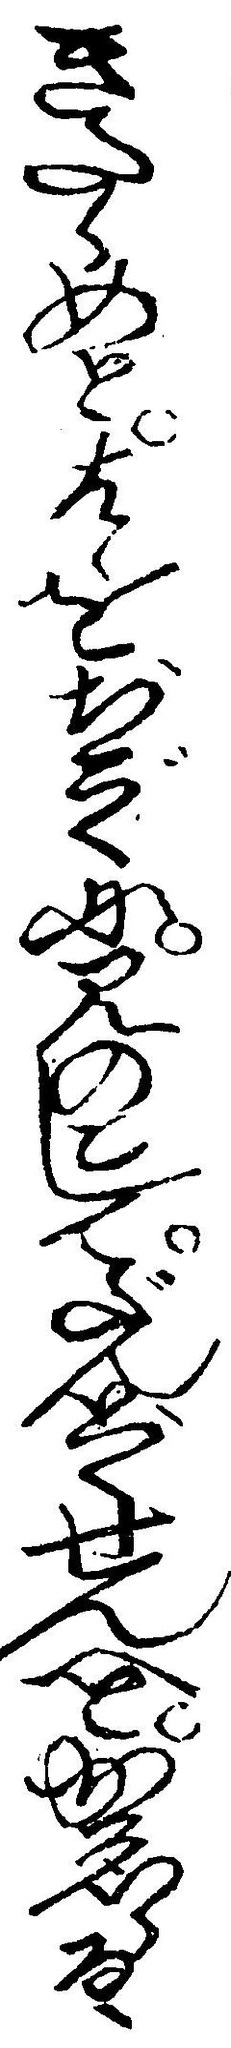きたらめと。はゝをぢごくに。見のこして。だんどくせんへと。かゑらるゝ
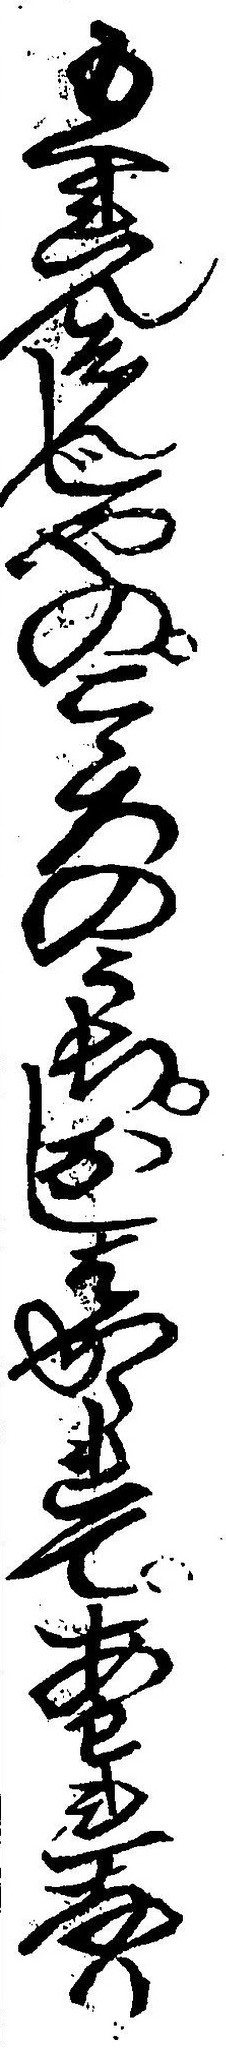もくれんそんじやの。こゝろのうち。おしはかられて。あわれなり
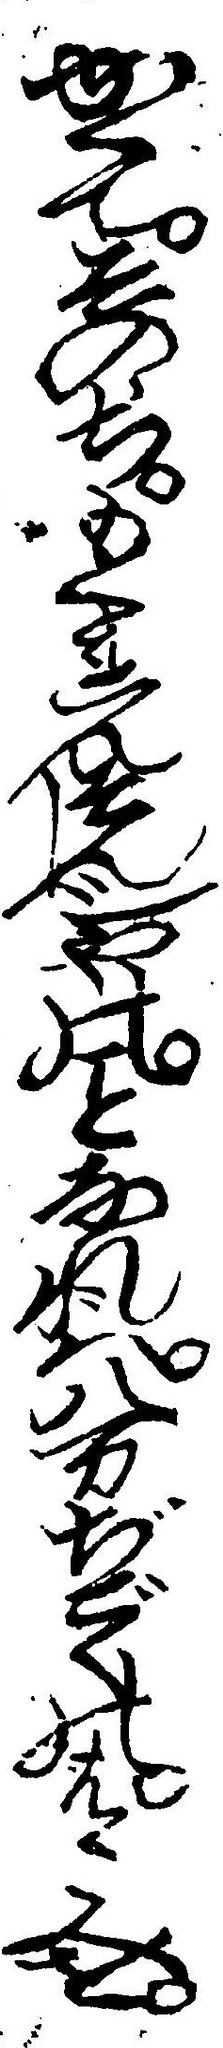かくて。そのゝち。もくれんそんじやの。ことなれば。八万ぢごくの。はゝみを。
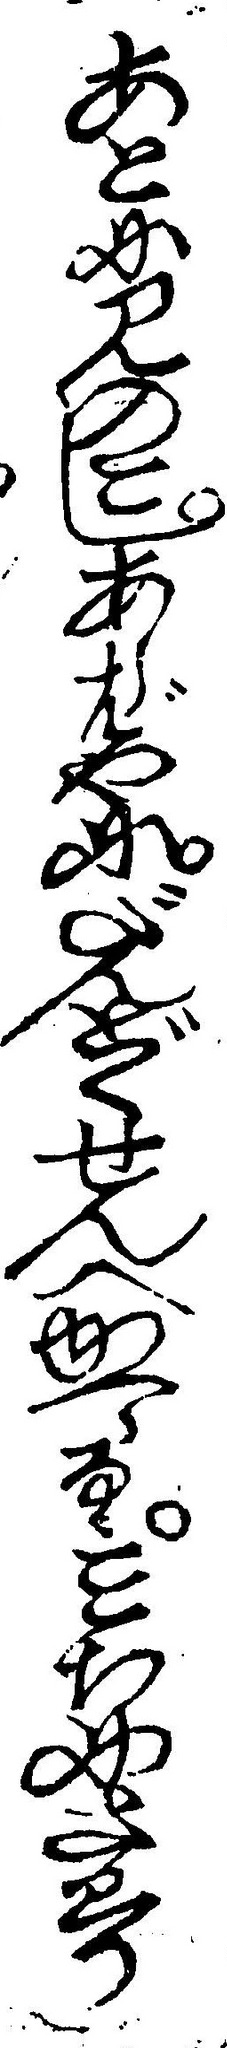あとに見のこし。あしばやに。だんどくせんへかへらるゝ。みちにさわりも。
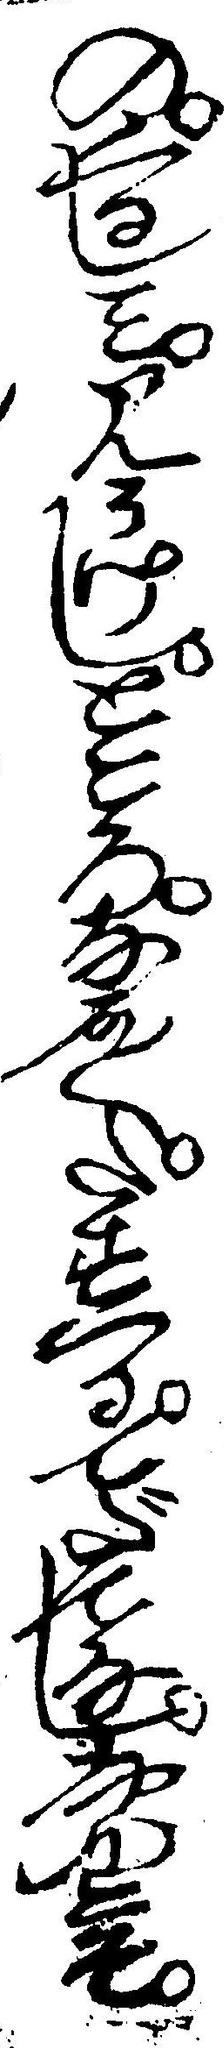のくるしみ。見かけし。ところ。なか〳〵。たすへる。てだてなし。なにとそ。
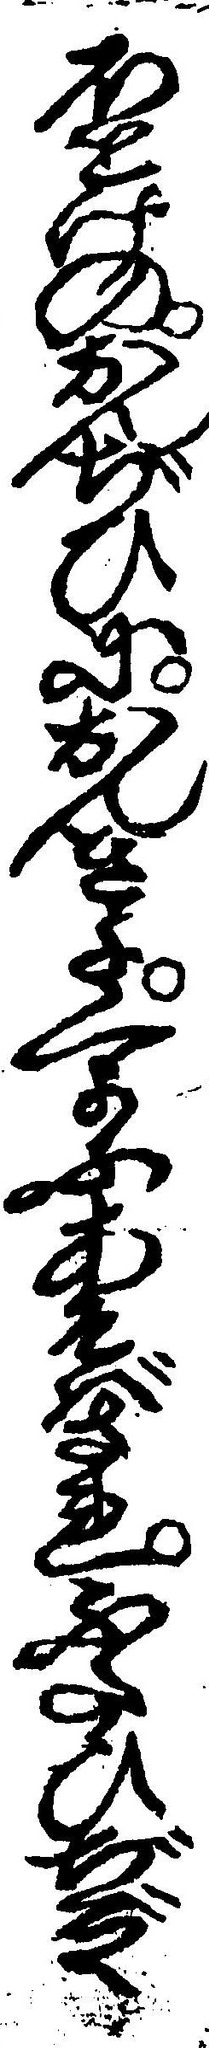ほとけの。おんぢひに。おんきよ。くよふあそばされ。ふたゝひぢごく
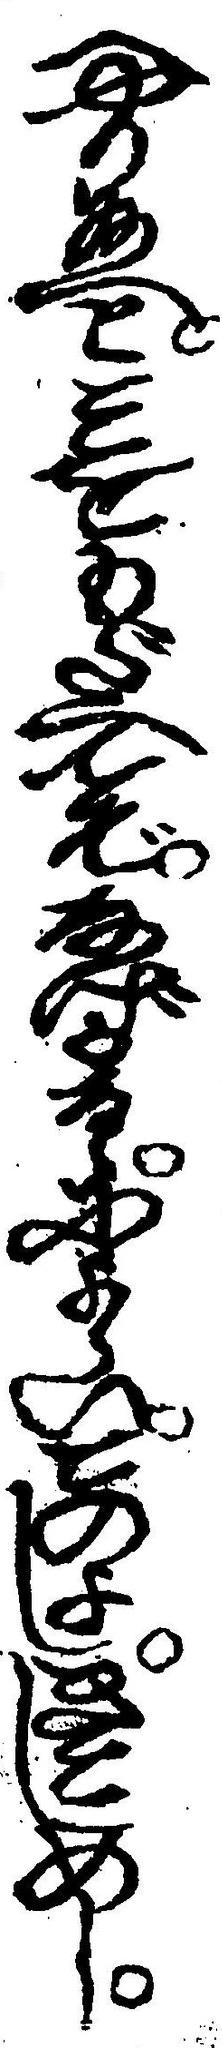へやり給へと。みをもだへてぞ。なげかるゝ。によらい。このよし。きこしめし。
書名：目連尊者地獄めくり / 宇留藤太夫正本
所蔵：東京大学総合図書館 General Library in the University of Tokyo, JAPAN
